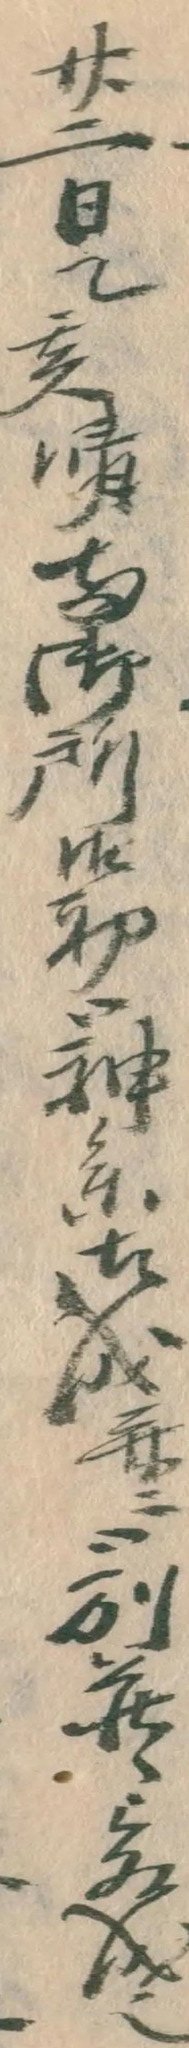廿二日乙亥済両御所御初御神参御成并ニ御別蔵へ被為成也
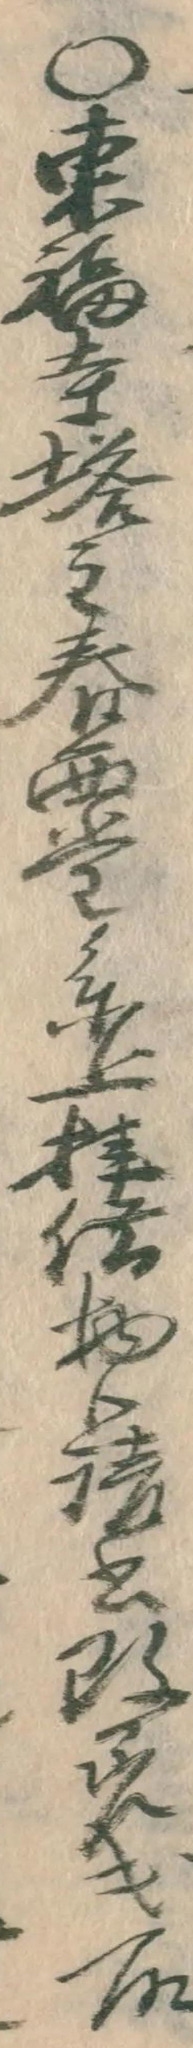○東福寺塔之春西堂参上拝借物御請書改罷出取
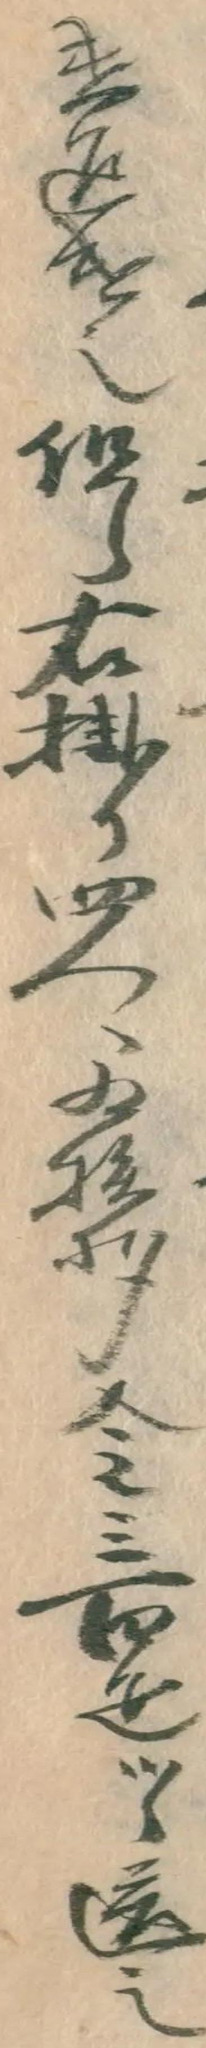遣返遣之但し右掛り四人へ為挨拶金三百疋ツヽ送之

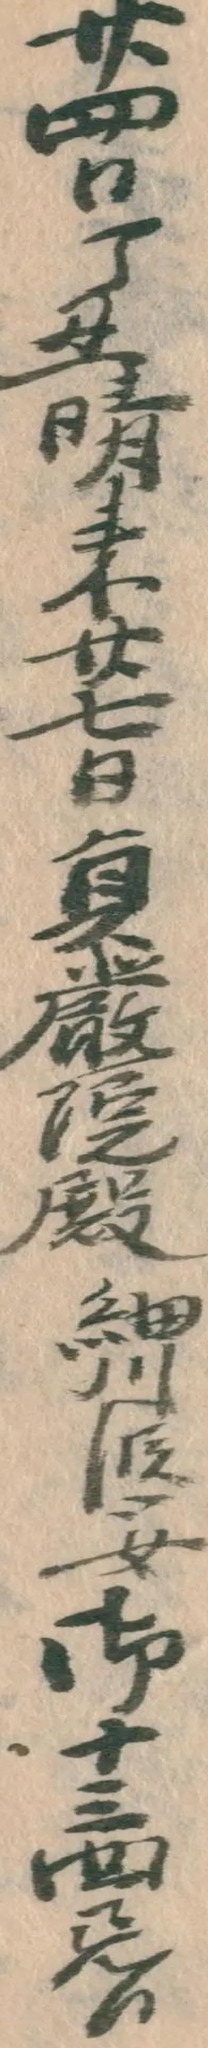廿四日丁丑晴来廿七日貞厳院殿細川殿御女御十三回忌日
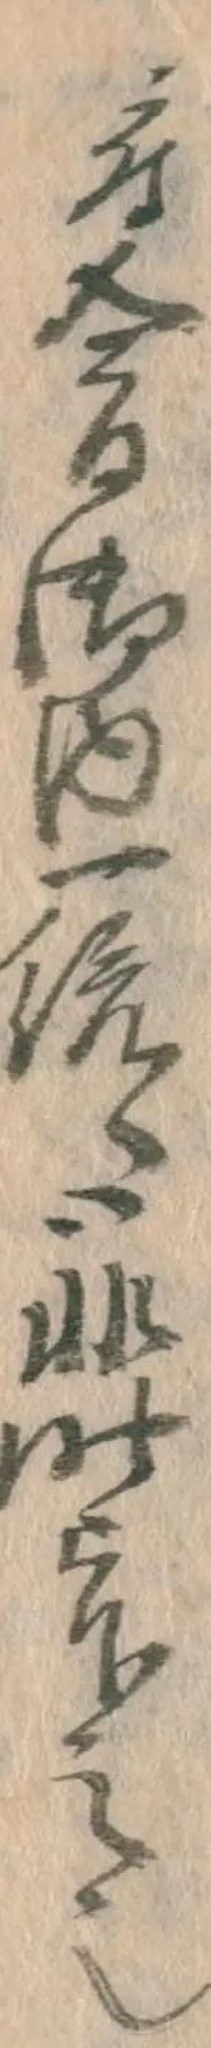ニ付今日御内一統へ御眼叶被下之也
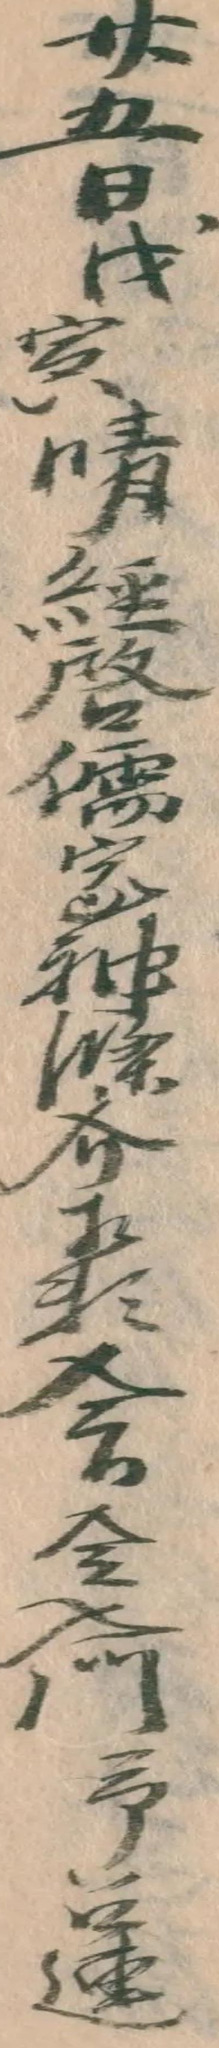廿五日戊寅晴経啓儒家神條介相頼今日令入門予召連
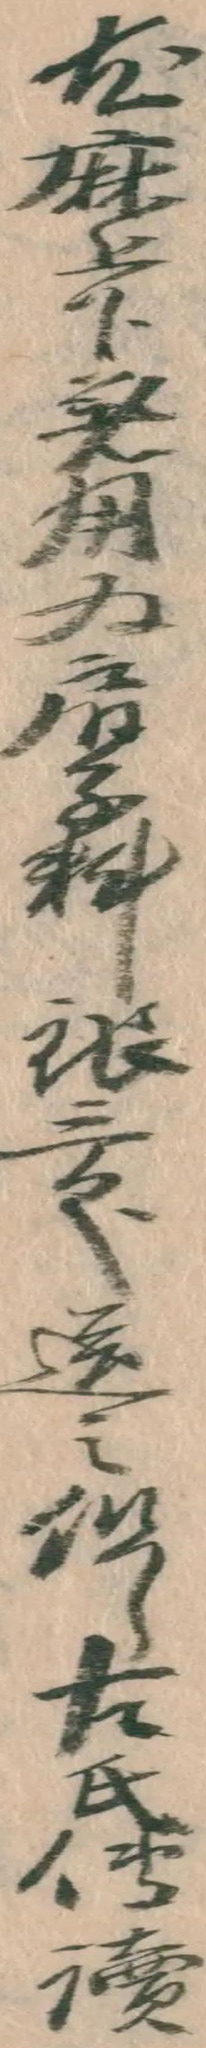尤麻上下着用為扇子料銀三匁送之但し左氏傳讀
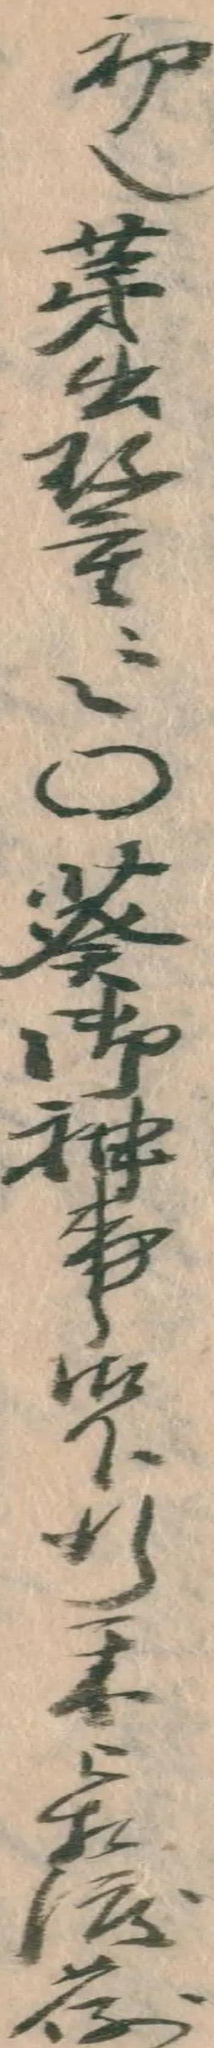初也茅出珍重々々◯葵御神事御下行米被相渡如例
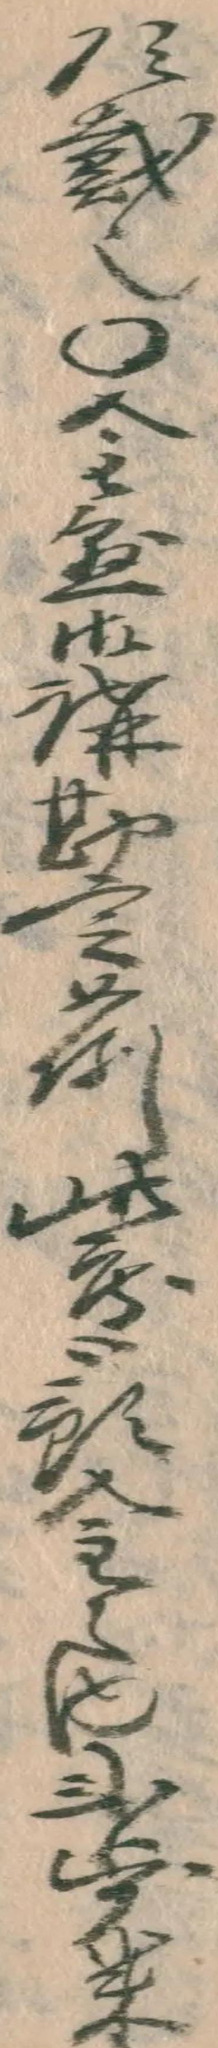頂戴之○金懸御講勘定如例此度御預金之内弐歩弐朱
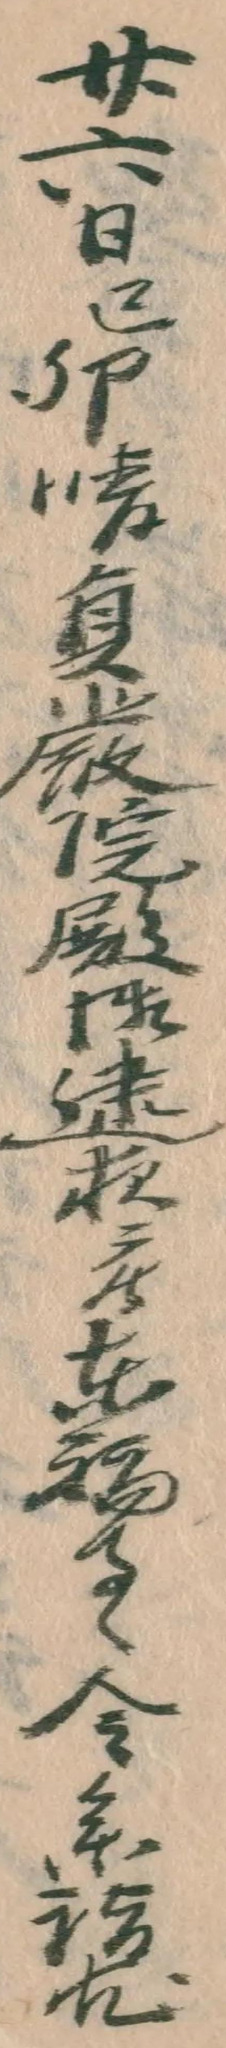廿六日己卯晴貞厳院殿御建夜ニ付東福寺へ令参詣尤
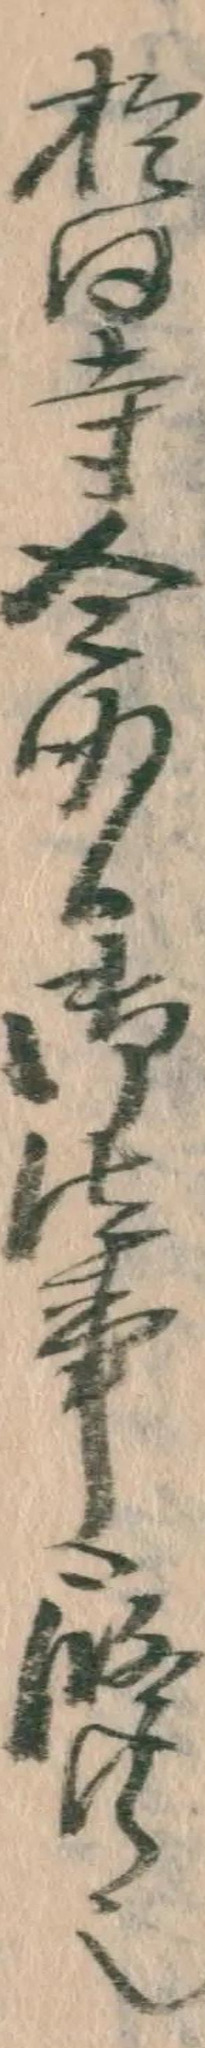於同寺今明日御法事御修行也
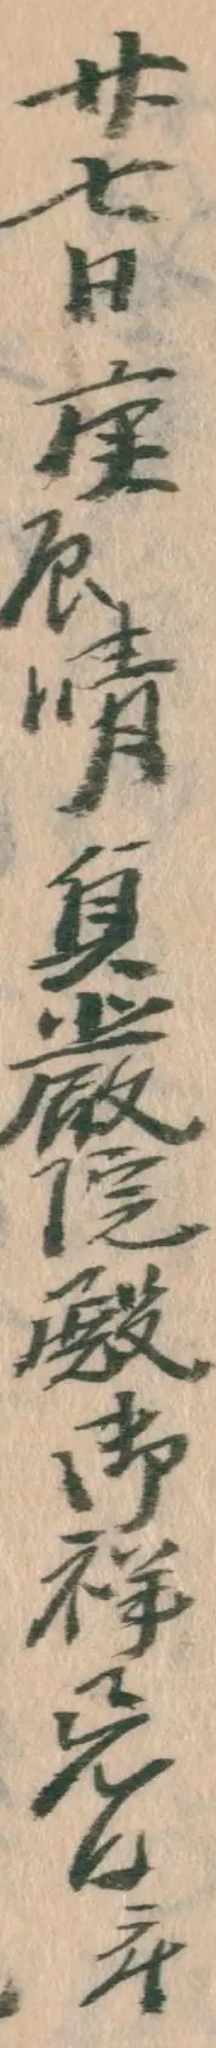廿七日庚辰晴貞厳院殿御祥忌日ニ付
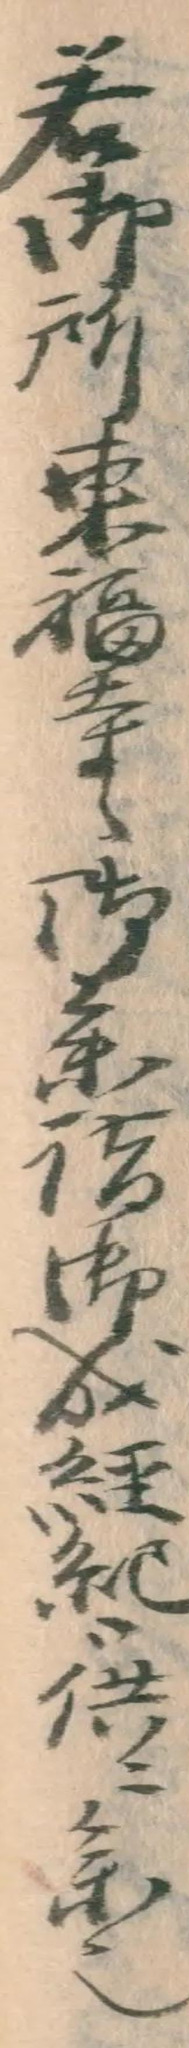若御所東福寺へ御参詣御成経紀御供ニ参也
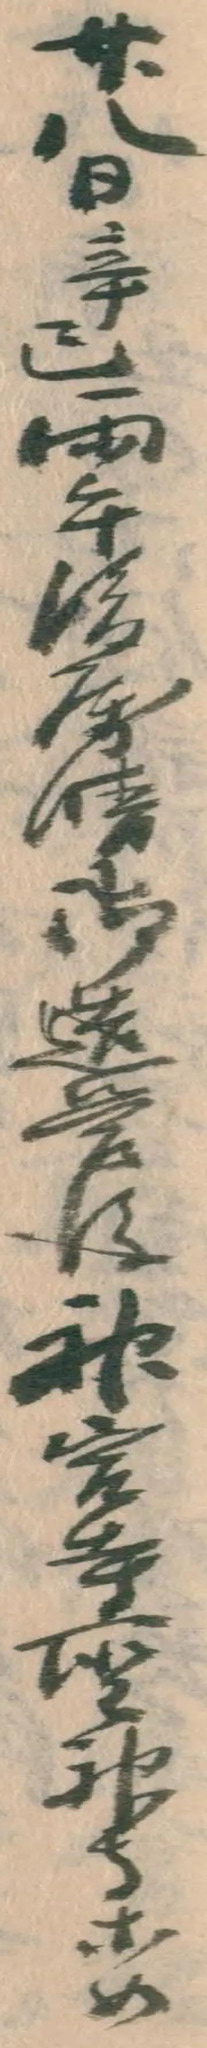廿八日辛巳雨午後属晴御造営後神宮寺聖神寺等如
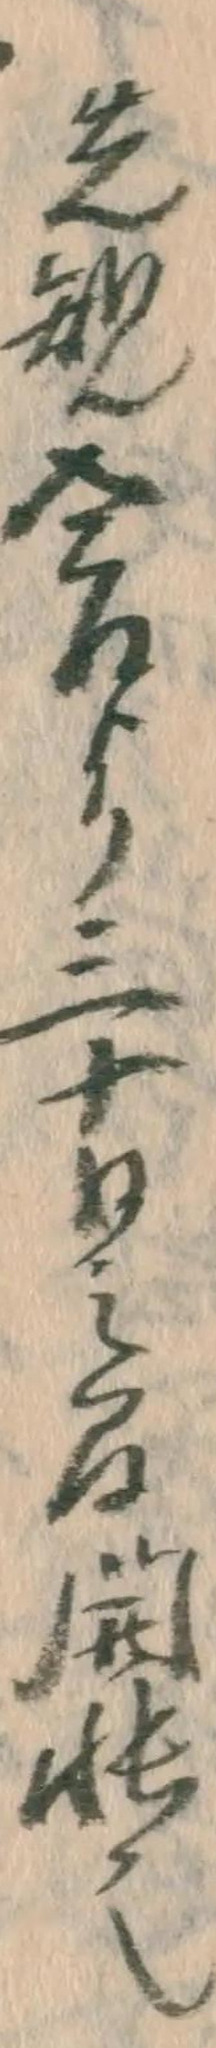先規今日より三十日之間開帳也
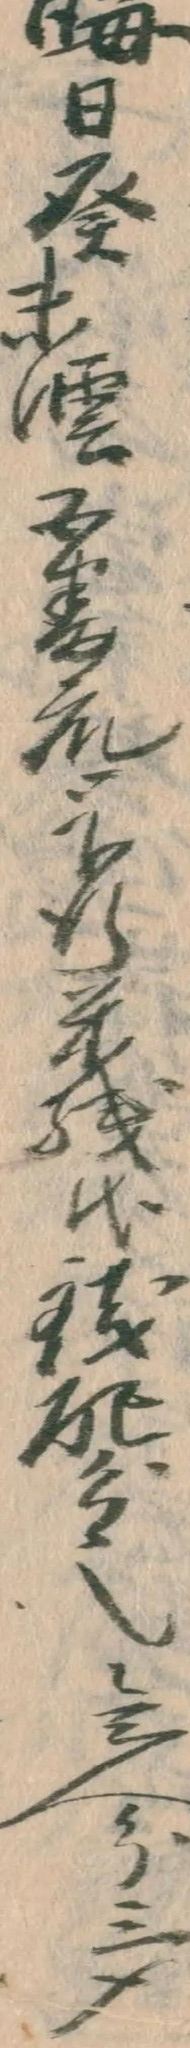晦日癸未曇五番衆御下行米銭代銭配分也壱人分三〆
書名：賀茂社記録. 第67冊
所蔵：国立国会図書館 National Diet Library, JAPAN
